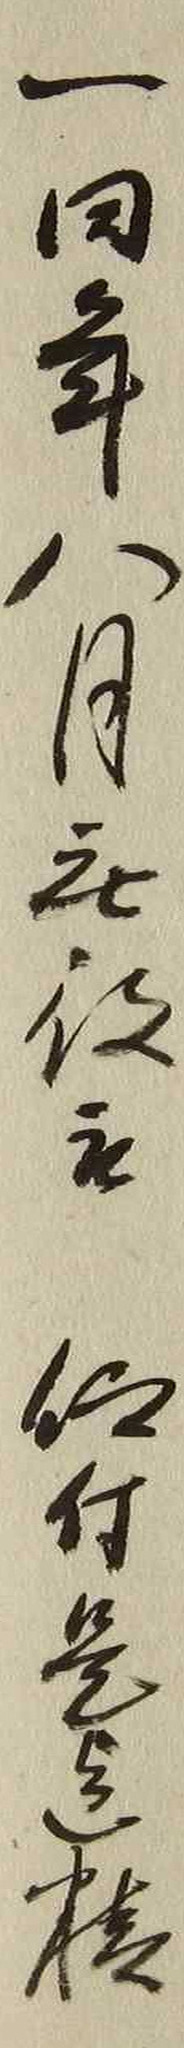一同年八月無役被仰付是迄精
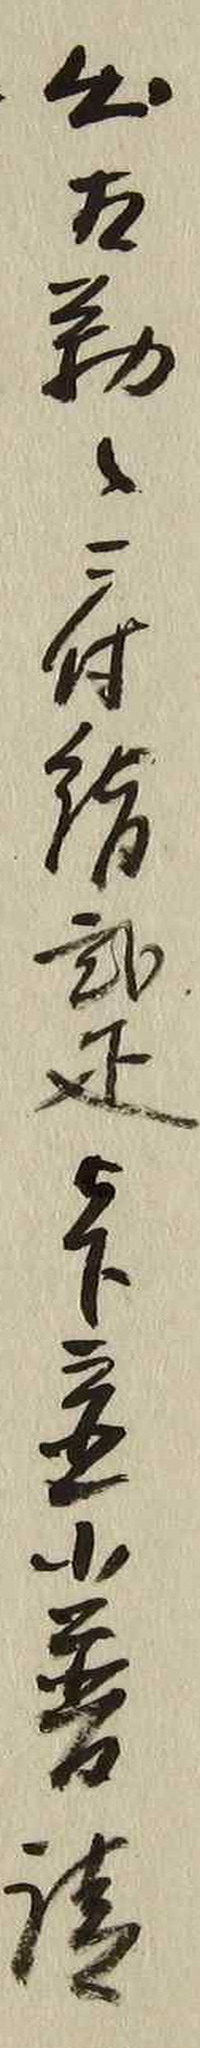出相勤候ニ付絹弐疋被下置小普請
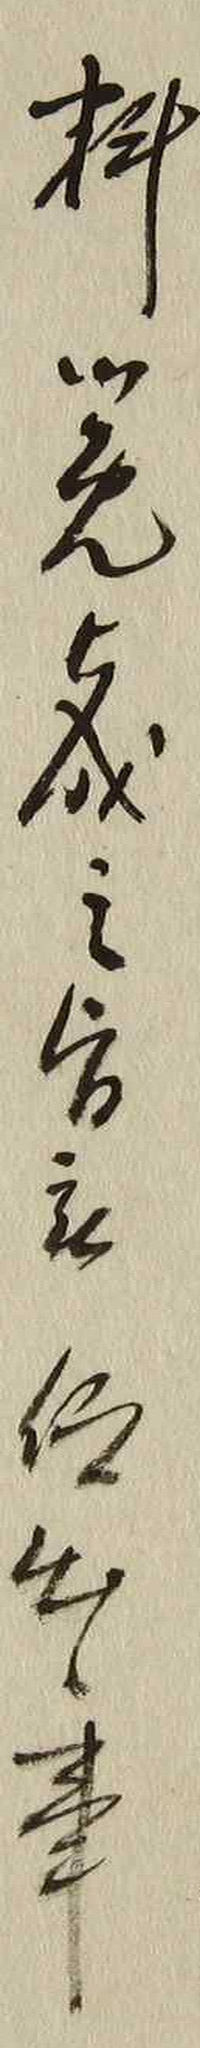料御免被成之旨被仰出候事
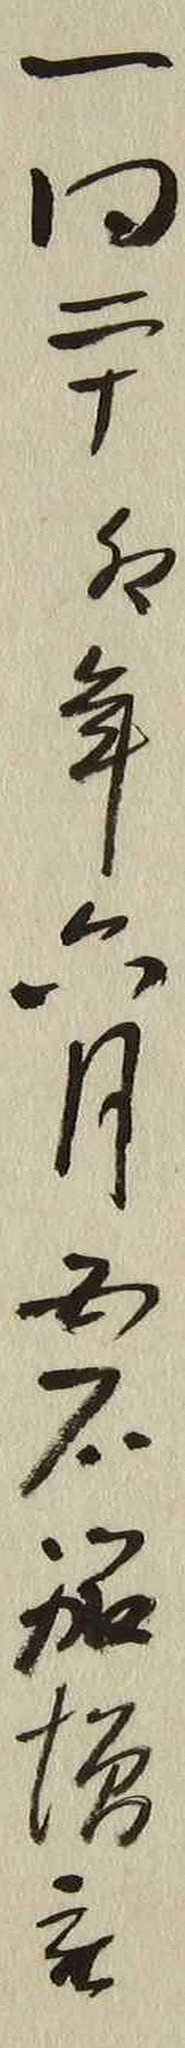一同二十卯年六月五石御加増被
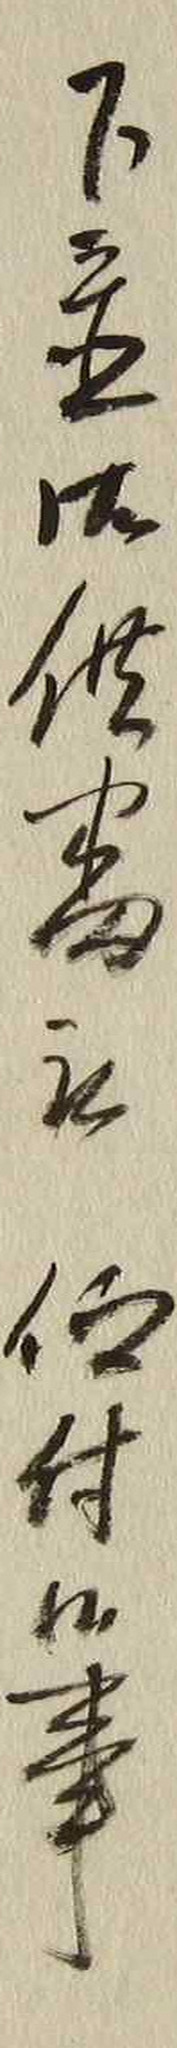下置御供番被仰付候事
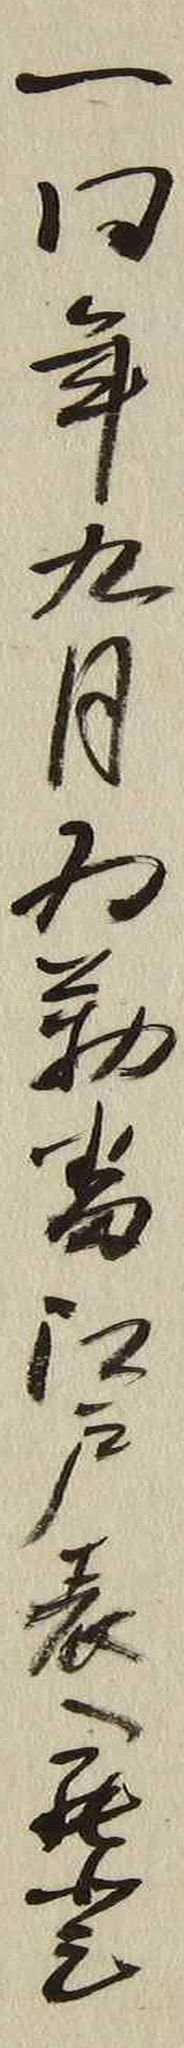一同年九月為勤番江戸表へ罷登
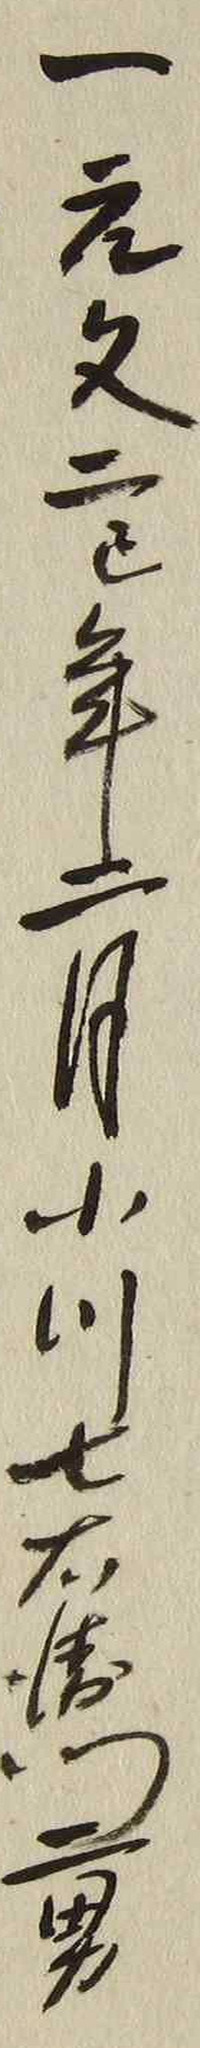一元文二巳年二月小川七右衛門二男
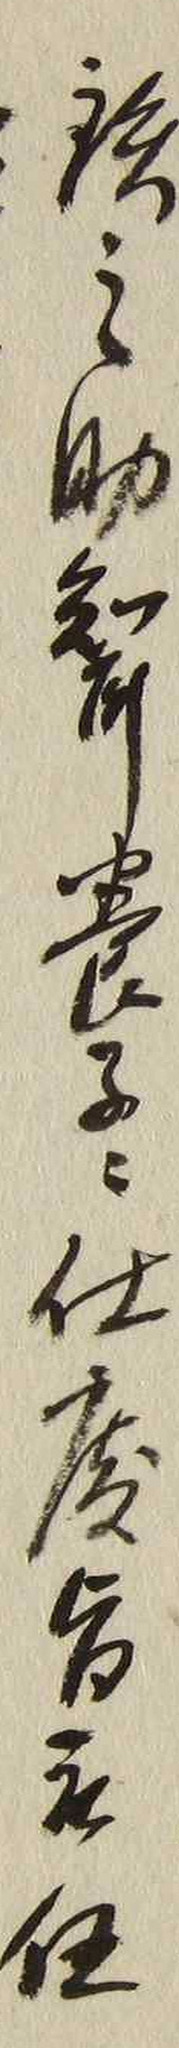鉄之助婿養子ニ仕度旨被任
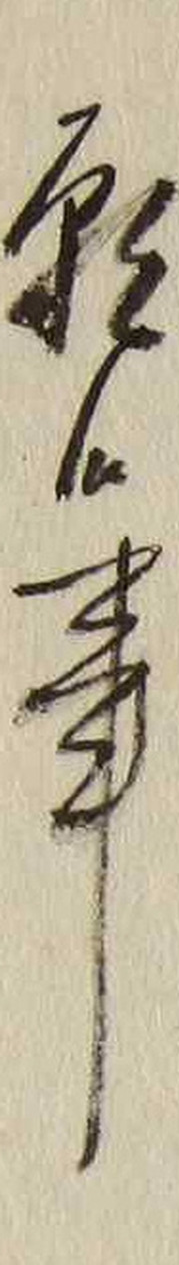願候事
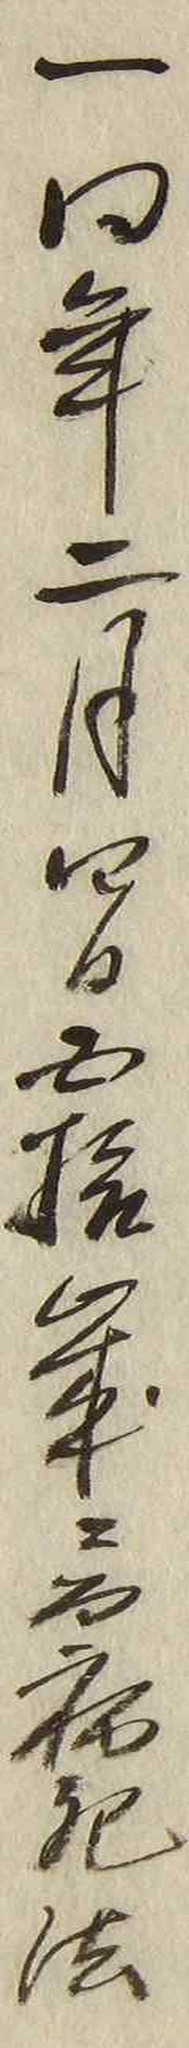一同年二月四日五拾歳ニ而病死法

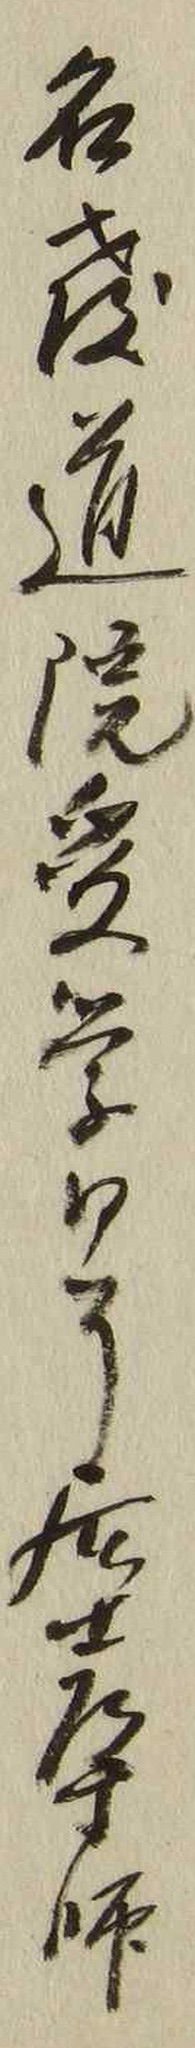名教道院愛学日了居士導師
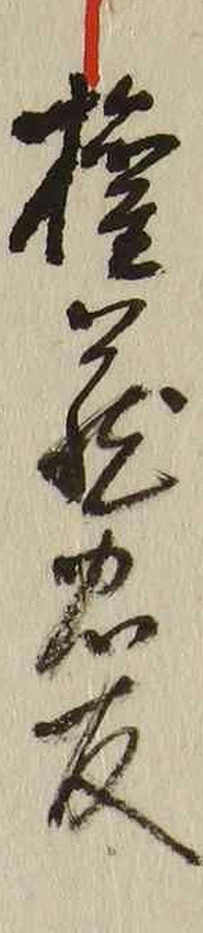権蔵忠友
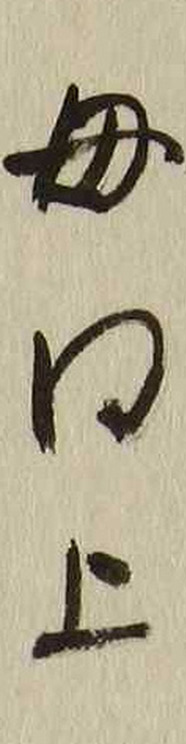母同上
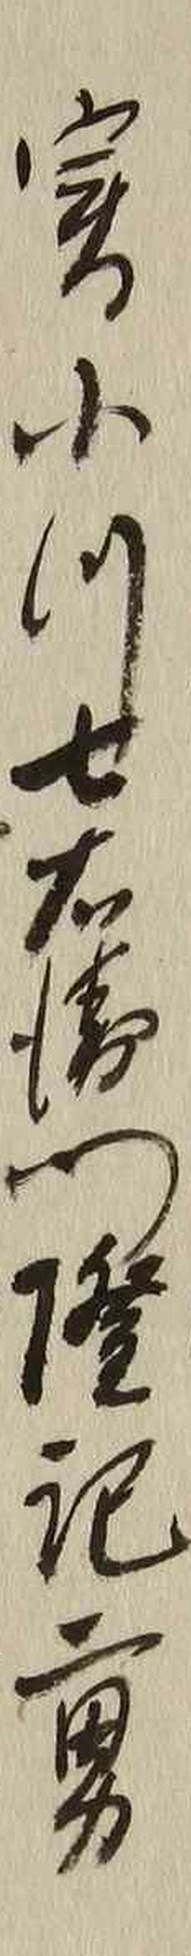実小川七右衛門隆記二男
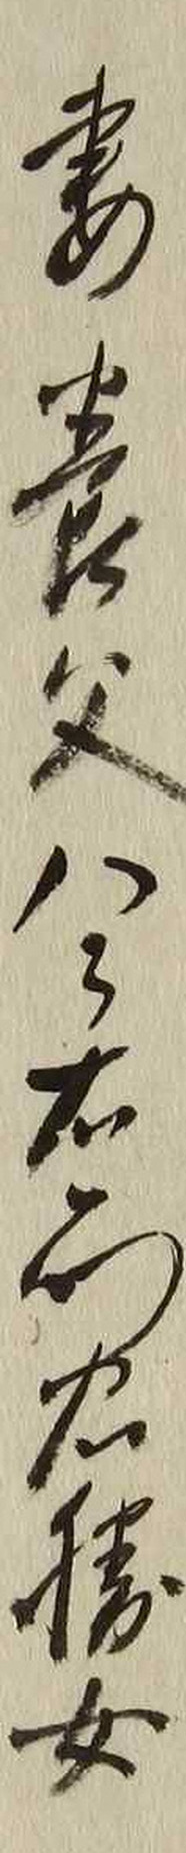妻養父八郎右衛門忠勝女
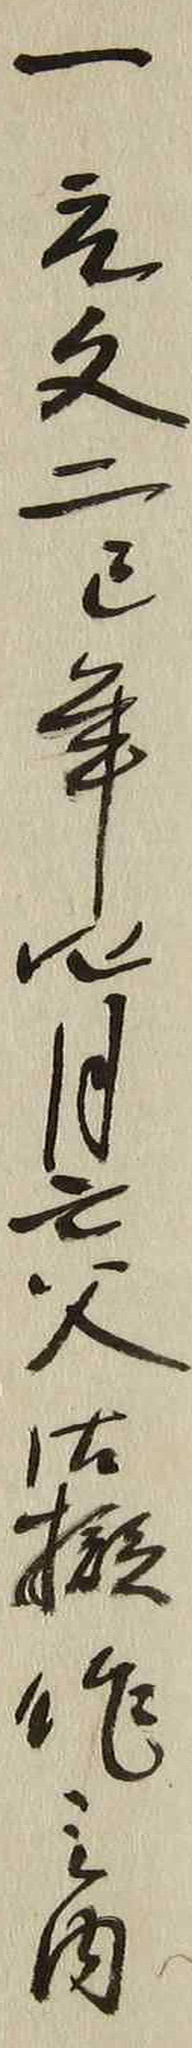一元文二巳年四月亡父御擬作之内
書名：諸士系譜　巻之359　す之部9
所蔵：会津若松市立会津図書館
